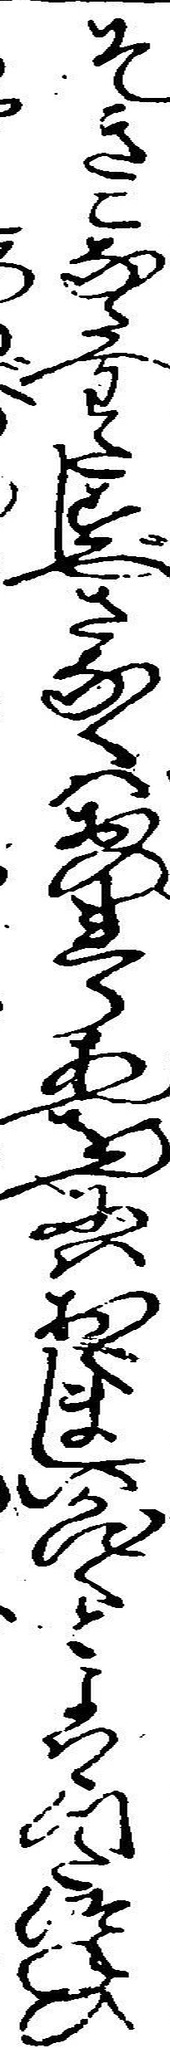そきこなたへわたすべしさなくはおのれらあんをんにはおくましいかに〳〵とよはゝつたつねひ
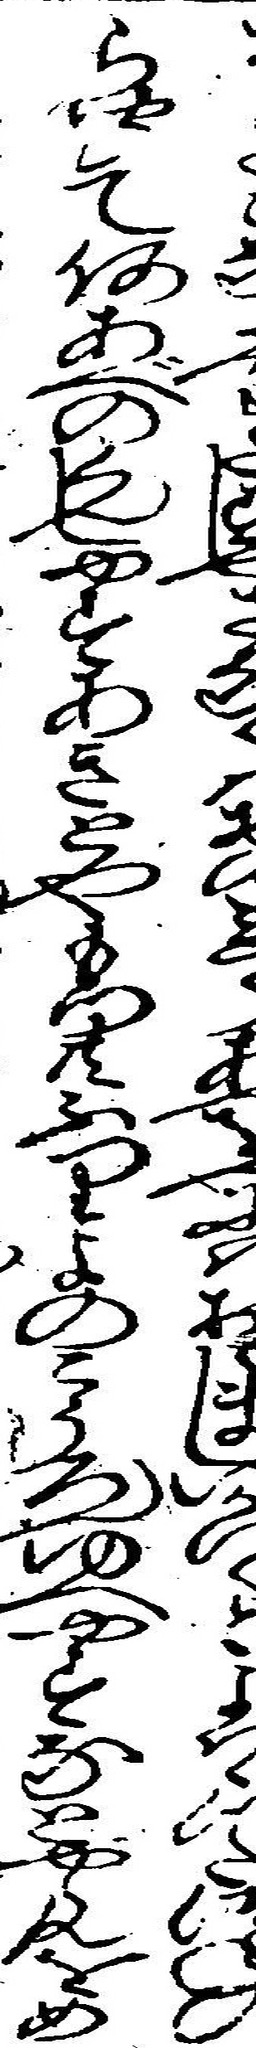ら聞てあべのくんしやすあきとやもつ共ふりよのこうろんゆへやすなとやらんをめ
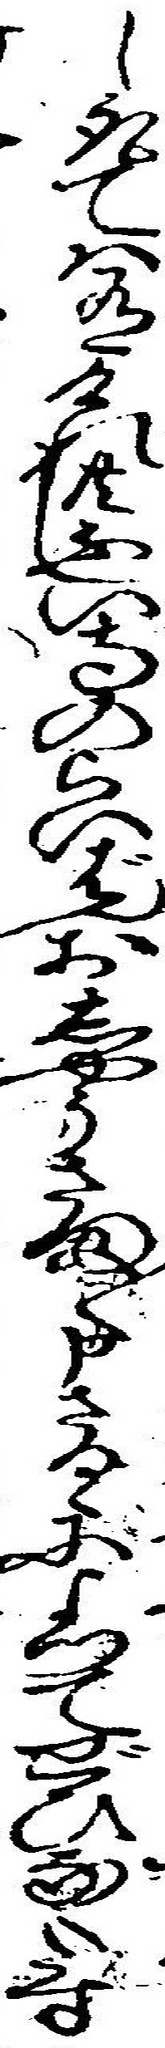し取ては有けれ共ふしい寺のらいばんおしやうさま〳〵申さるゝによつてぜひなくたす
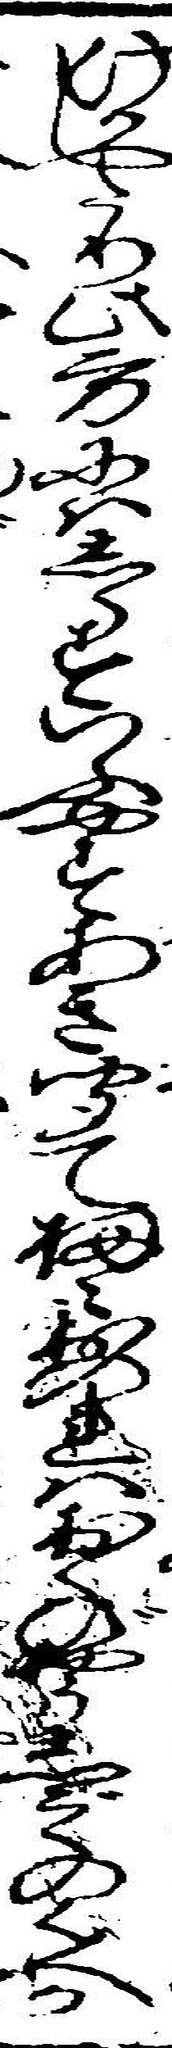けかへしたり此方にはしらすいふやすあき聞て扨々おのれはおくびやうしごくのく人か
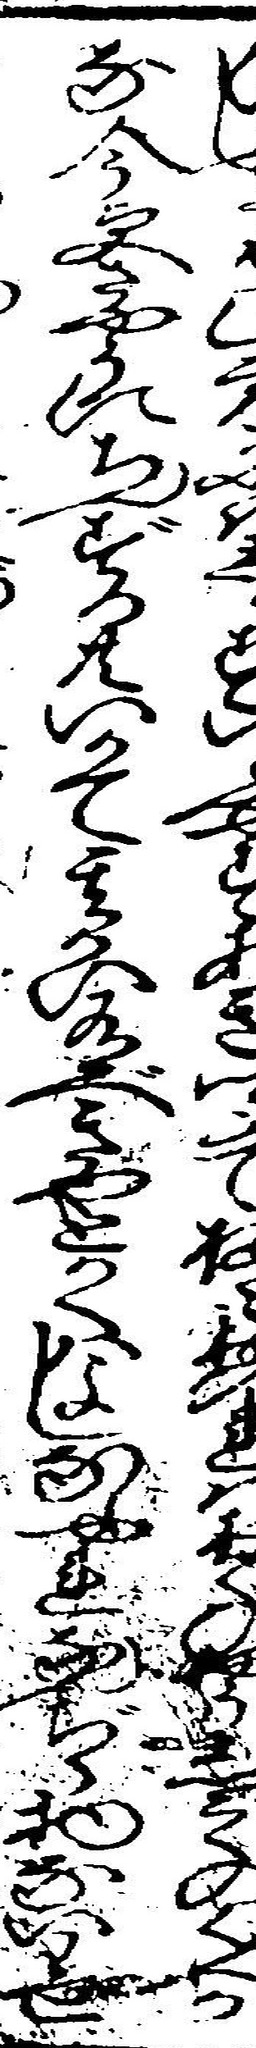な今更さやうにちんずる共いかて其かい有べきやとかくはよしなしやれなんぢら物ないわせ
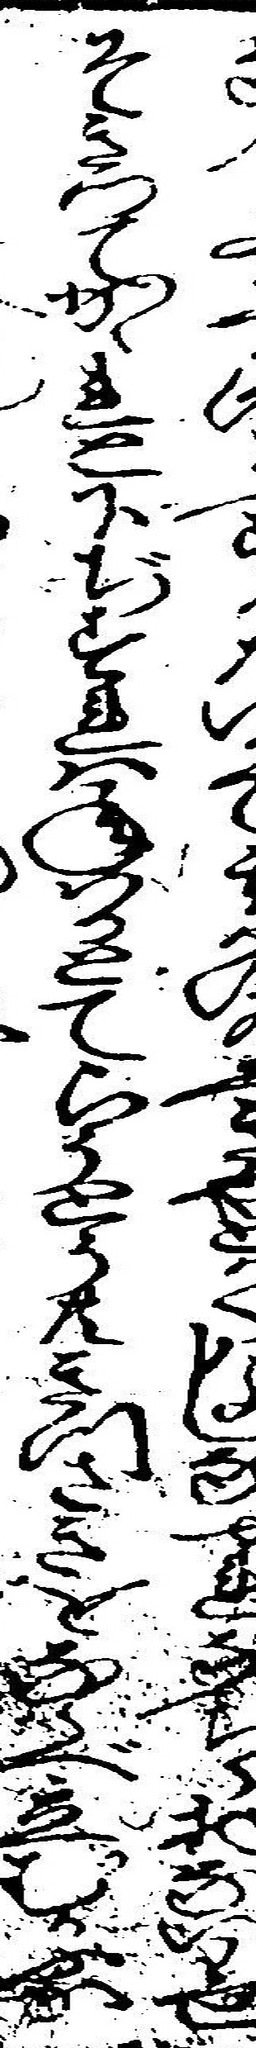そきつてかゝれと下ぢすれは承はるとてらうとう共きつさきをならべ立むかふか
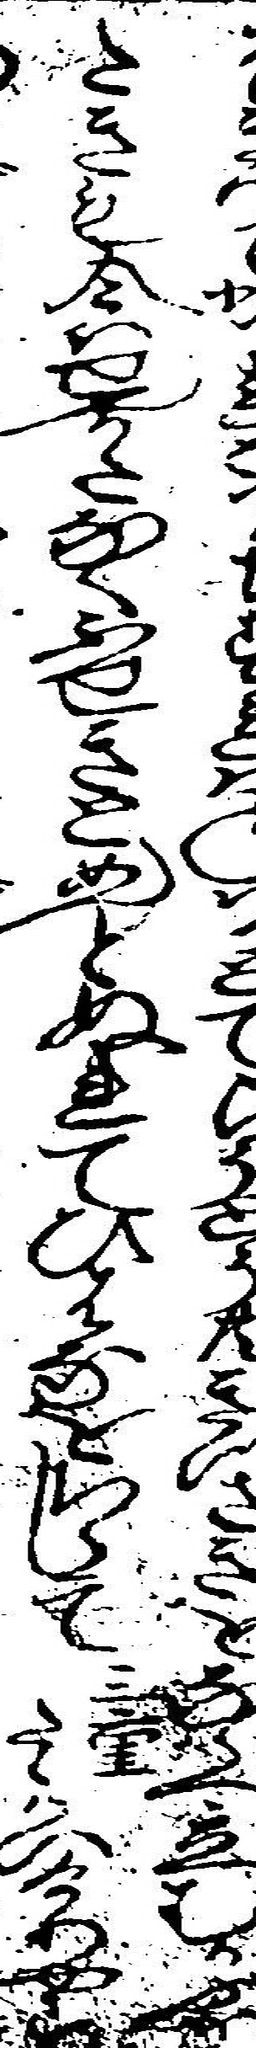たきも今はせんかたなくふせきとめんとぬれてひはなをちらして三重たゝかいけりやす
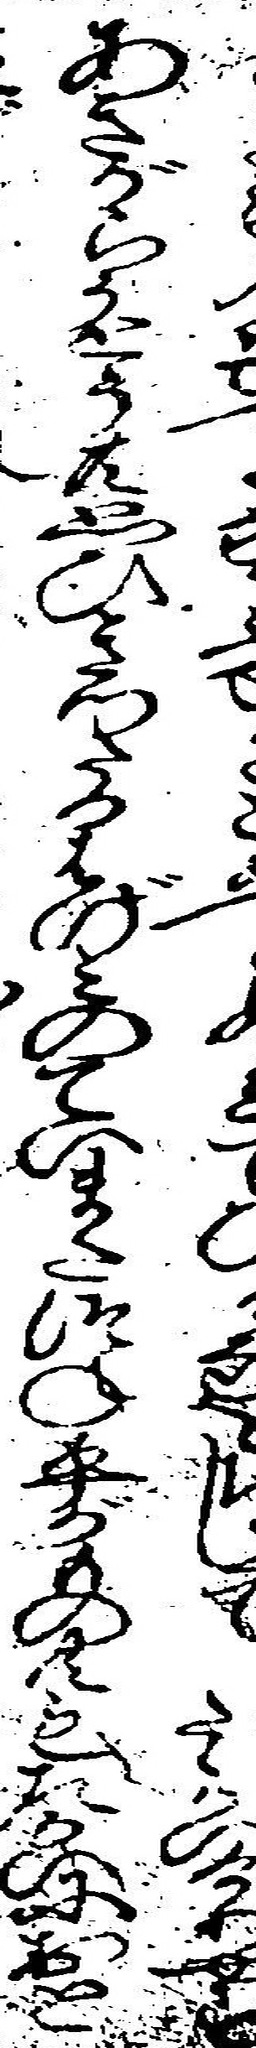あきがらうとうとも思ひきつたるはげみのていまたつね平がもの共もたかいにおと
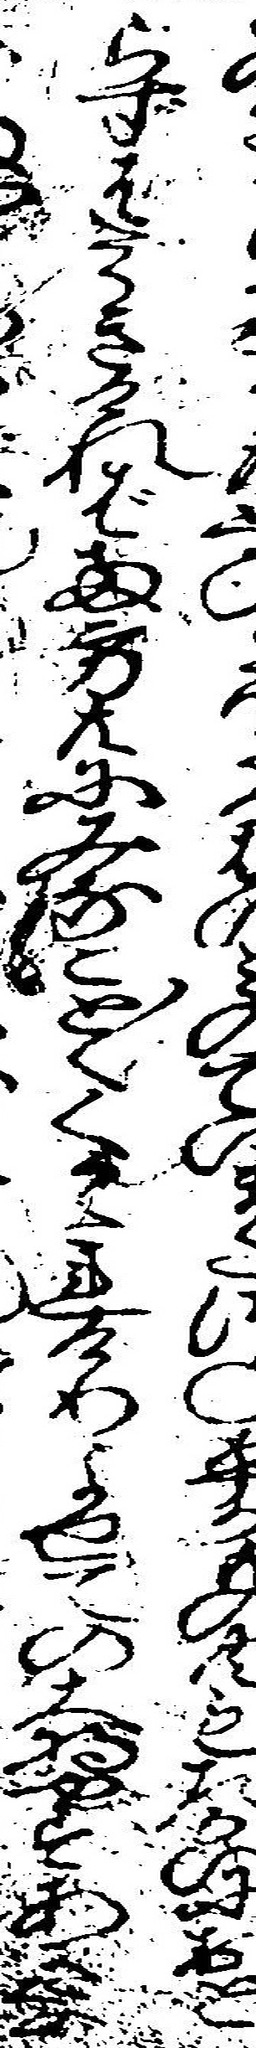らずはたらきければ両方共にみなこと〳〵くうたれけりよせての大将やすあきな
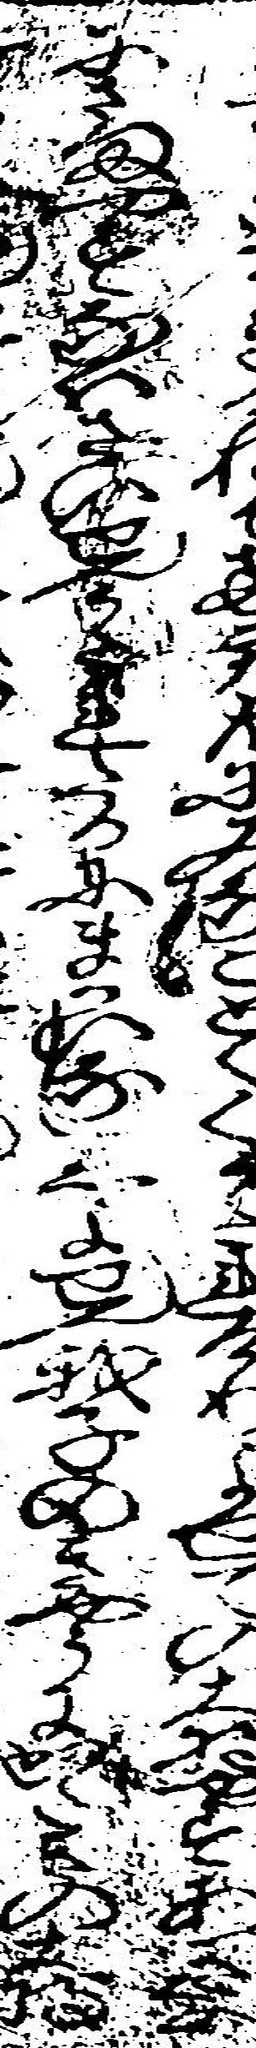にさまやすなはさいせんうたれたるにまかいなししよせん我子のきやうにかたきの大将

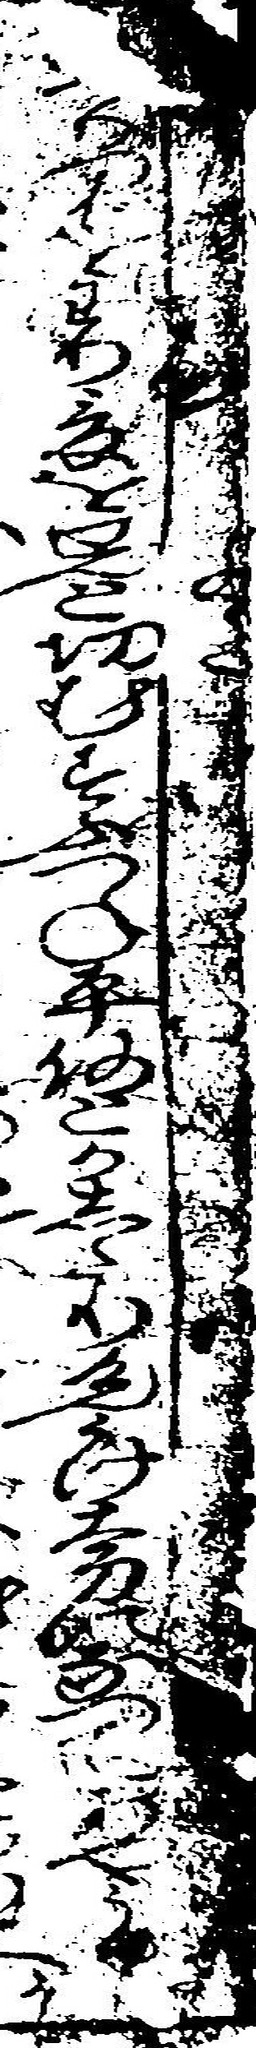つばをわり爰をせんと切むすふつね平何とかしたりけんうけ太刀になつてあやう
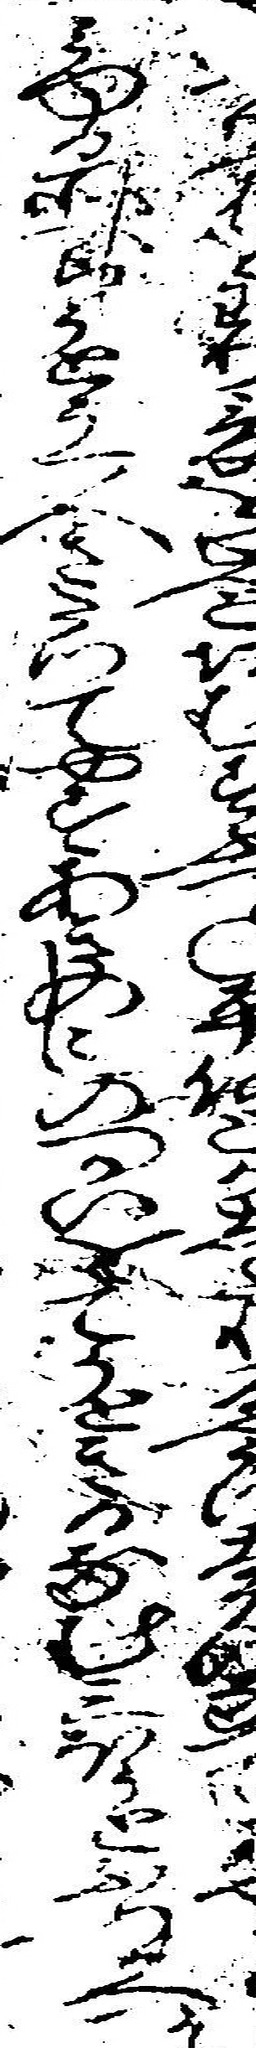みゆる所へらうとう一人きたつてやすあきのこしのつかいをてうときるなむ三ほうとふりかへつ
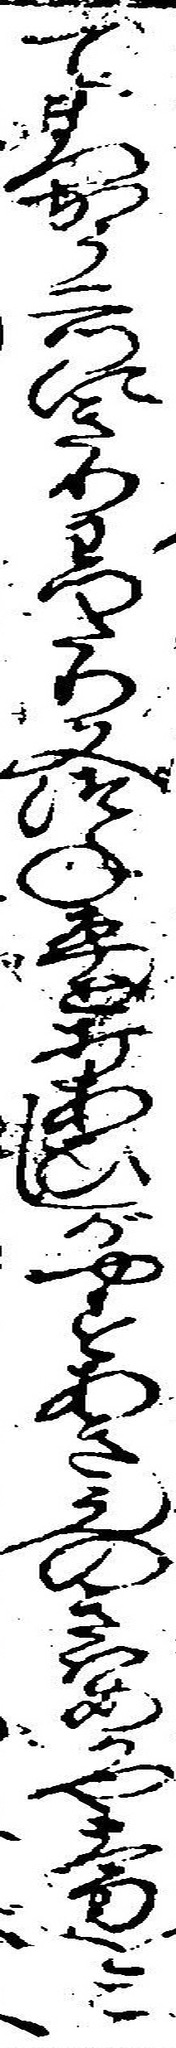てまつかう二つにきりわつたり又つね平と打あひしがやすあきうんのきはめかや太刀をと
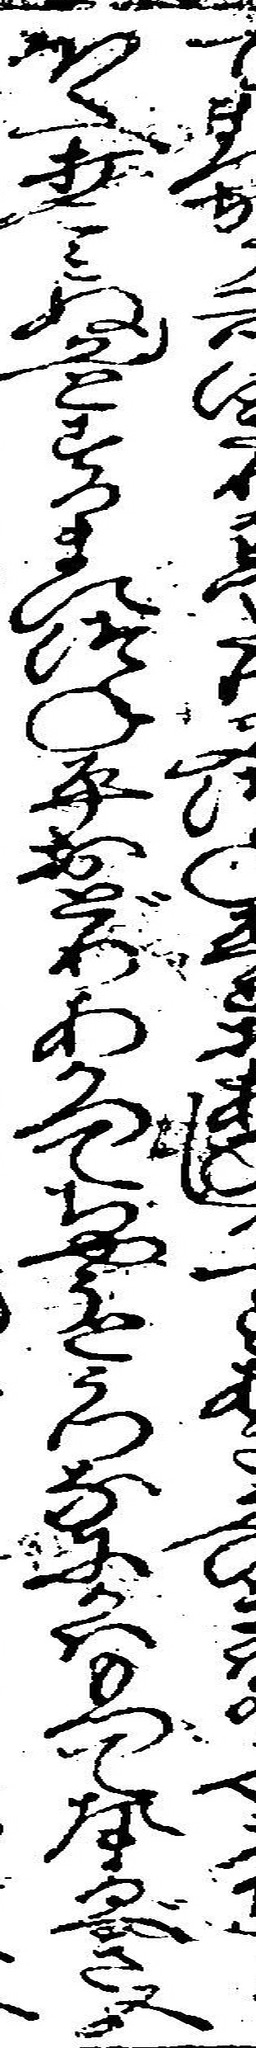ほくへ打こみぬかんとするまにつね平おどりあかつてちやうとうつなにかはもつてたまるべき五
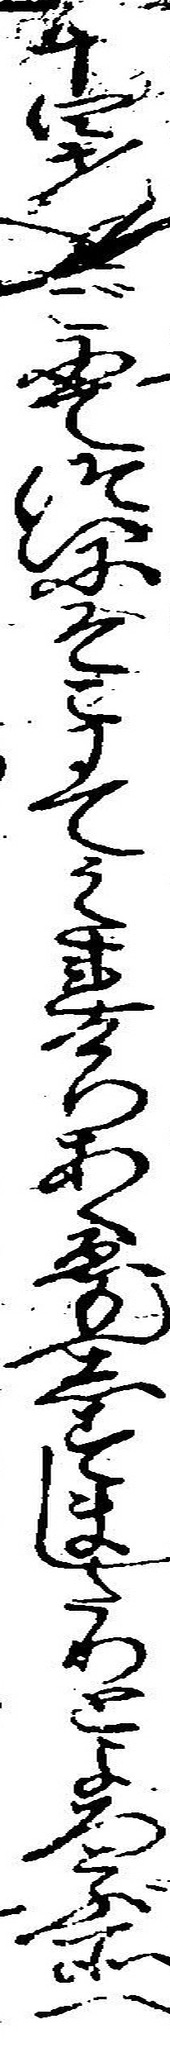十四才一ごにてついにそこにてうたれけりあくゑもんしすましたりとよろこぶ所へ
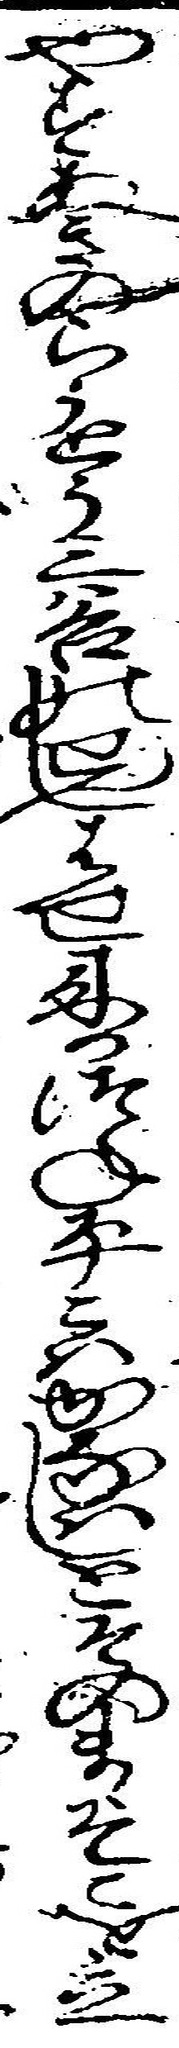やすあきのらうとう三谷のせんしはせ来るつね平こはかなはしとそのまゝそこを立
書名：[しのだづまつりぎつね付あべの清明出生]
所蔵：東京大学総合図書館 General Library in the University of Tokyo, JAPAN
